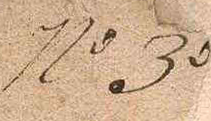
No 3o
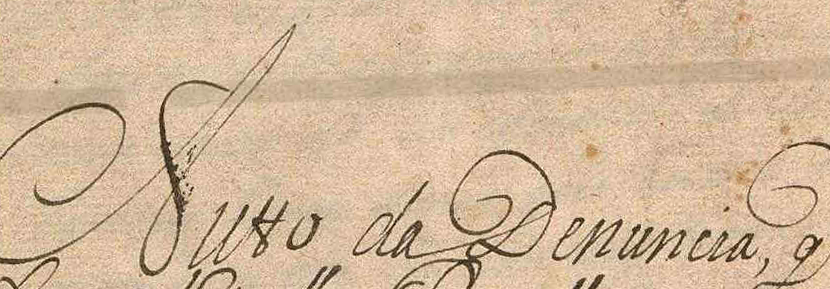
Autto da Denuncia, q̄
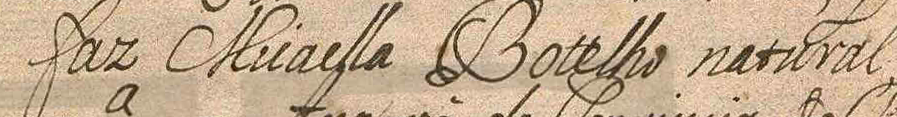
faz Micaella Botelho natural,
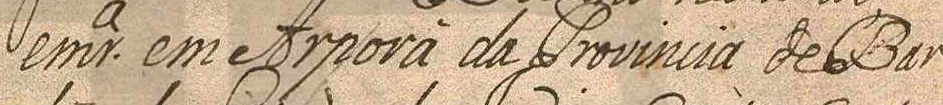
e mr.a em Arporã da Provincia de Bar
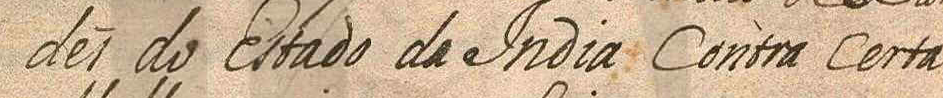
dés do Estado da India Contra certa
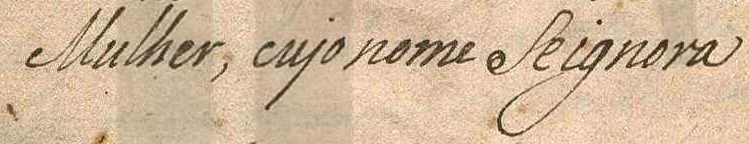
Mulher, cujo nome Se ignora
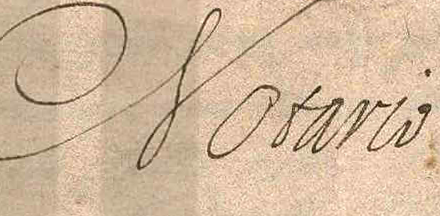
Notario
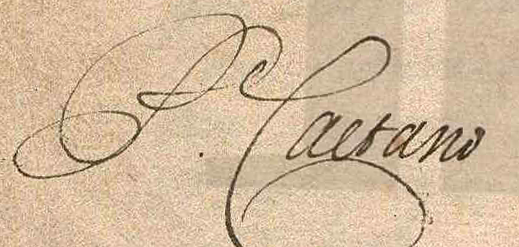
P.e Caetano
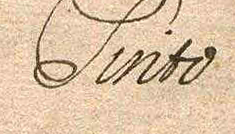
Pinto
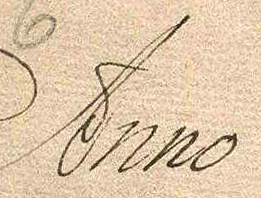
Anno
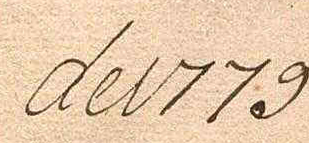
de 1779
